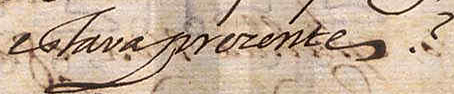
estaua prezente?
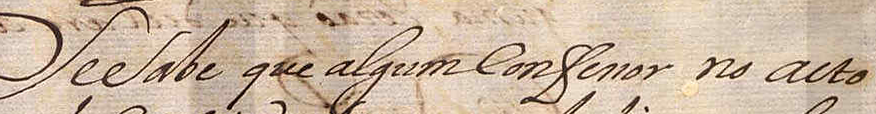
Se Sabe que algum Confessor no acto
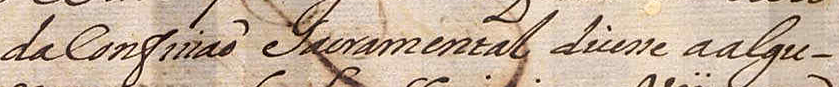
da Confissaõ Sacramental dicesse a algu
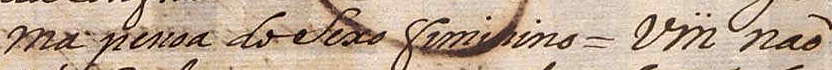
ma pessoa do Sexo feminino = V M naõ
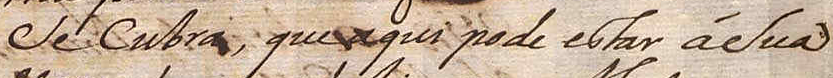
se Cubra, que aqui pode estar á Sua
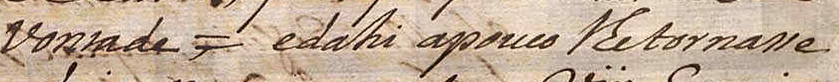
vontade = e dahi a pouco lhe tornasse
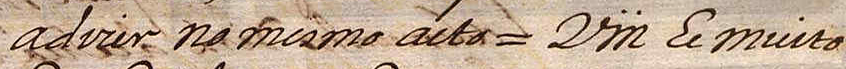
a dizer no mesmo acto = V M he muito
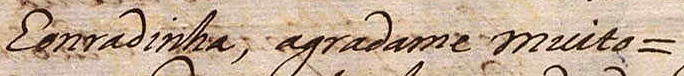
honradinha, agradame muito =
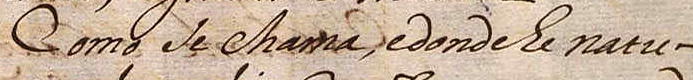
Como se chama, e donde he natu
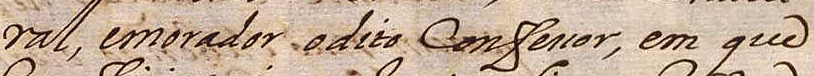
ral, e morador o dito Confessor, em que
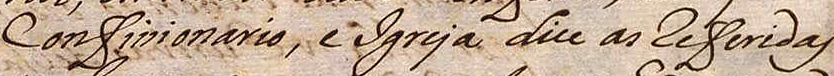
Confissionario, e Igreja dice as Referidas
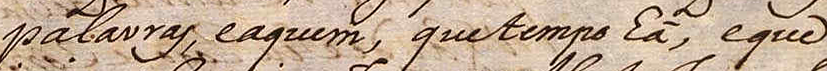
palauras, e a quem, que tempo há, e que
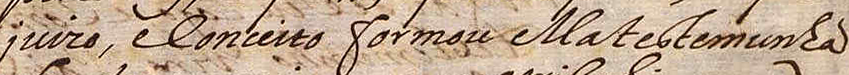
juizo, e Conceito formou ella testemunha
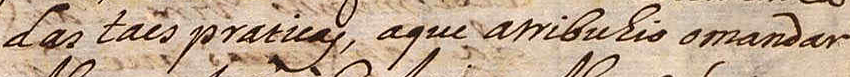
das taes praticas, a que atribuhio o mandar
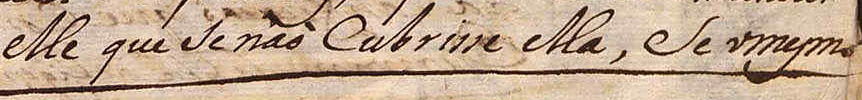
elle que se naõ Cubrisse ella, Se o mesmo
